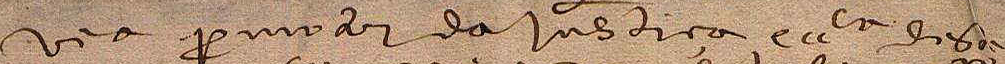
vea ꝑmotor da Justiça eccca deste
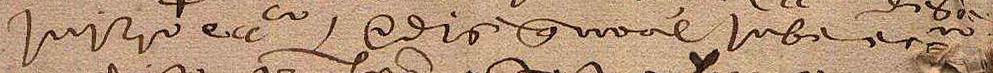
Jujzo eccco / e dise q̄ no alJube ec_co
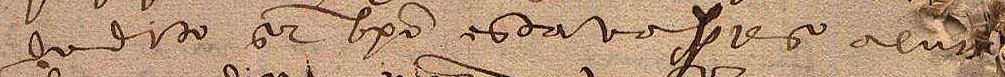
do dito s̄or bpō estava preso aluro
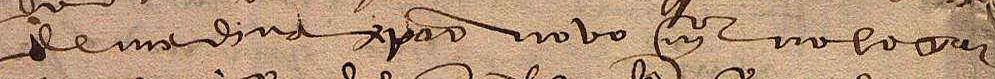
de medjna xpão novo mor no logar
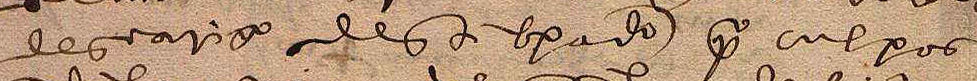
descarigo deste bpadō p̄o culpas
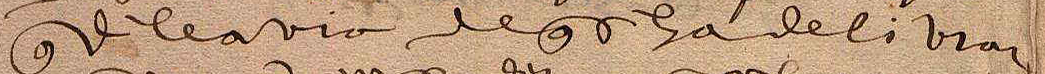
q̄ dele avia de q̄ se ha de livrar
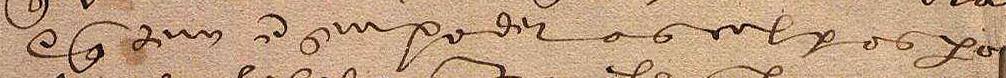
e q̄ tem ē seu poder as culpas ꝑa
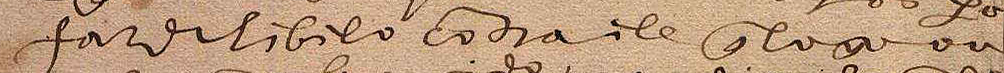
fazer libelo cōtra ele q̄ logo ou
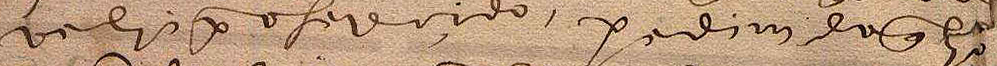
ve hj p̄ ofereçido, pedimdo q̄ ho
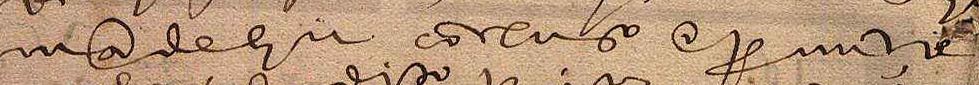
māde hir cōcluso e ꝓ merçe
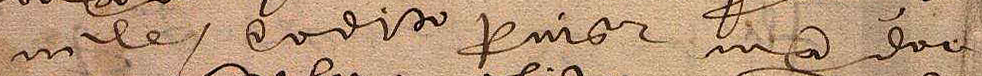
nele / e o dito ꝓuisor mādou
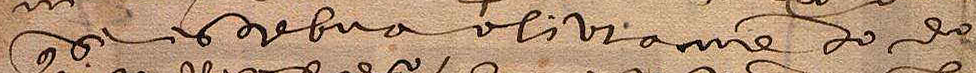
q̄ se estrebua o livramēto do
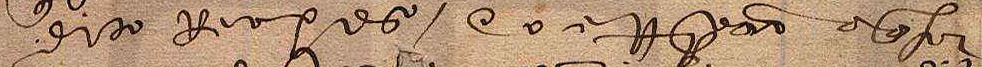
dito Reo preso / e o estp̄vão a q̄ for
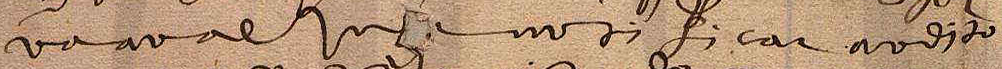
va ao alJu_ notificar ao djto
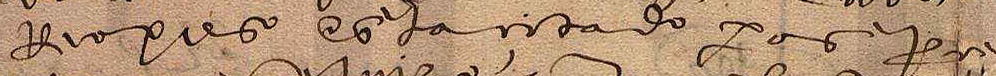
Reo preso e seJa çitado ꝑa se ꝓçe
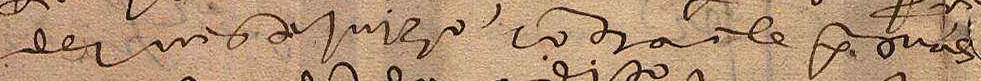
der neste Juizo cōtra ele p̄ suas
